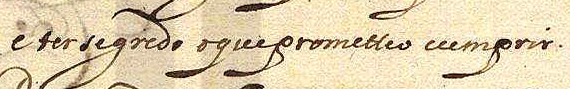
e ter segredo o que prometteo cumprir.
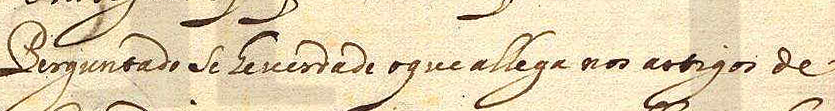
Perguntado se he verdade o que allega nos artigos de
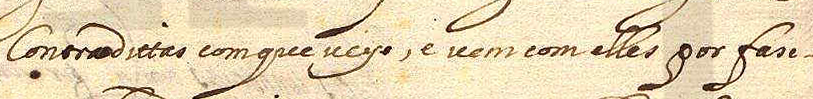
Contradittas com que ueyo, e uem com elles por fase
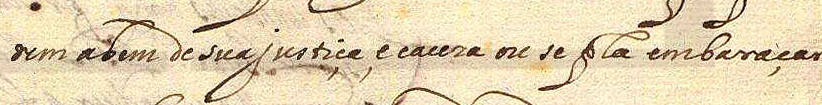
rem a bem de sua justiça, e cauza ou se pla embaraçar
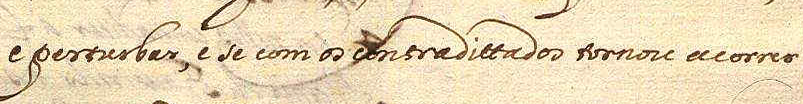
e perturbar, e se com os contradittados tornou a correr
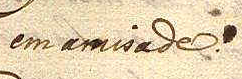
em amisade.
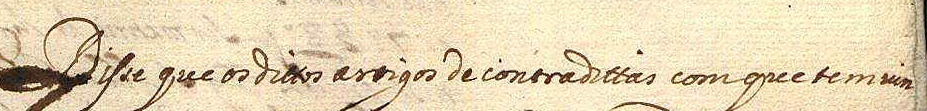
Disse que os dittos artigos de contradittas com que tem uin
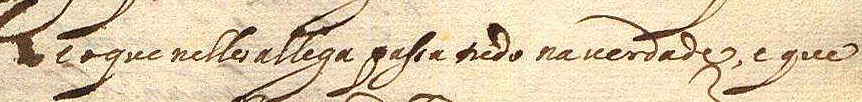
do e o que nelle allega passa tudo na uerdade, e que
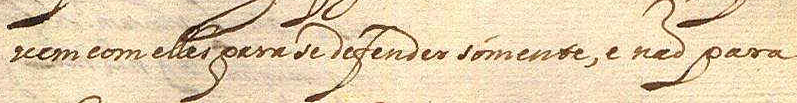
uem com elles para se defender somente, e naõ para
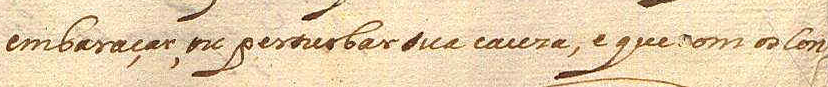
embaraçar, ou perturbar sua cauza, e que com os Con
